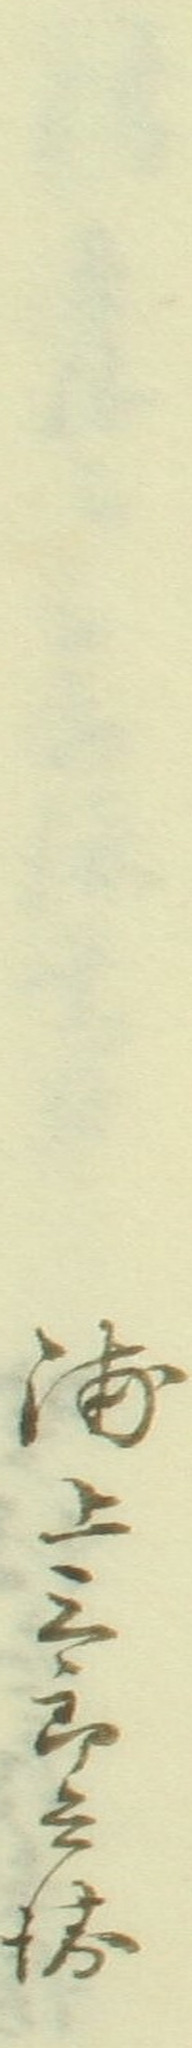浦上三郎兵衛
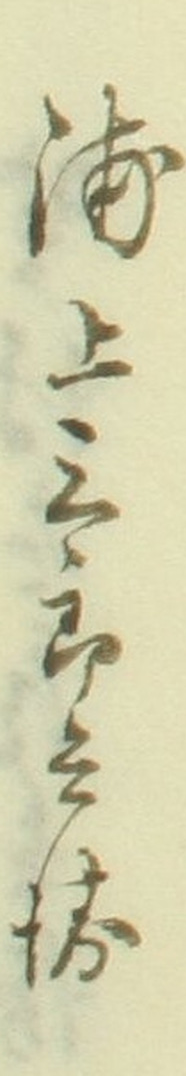浦上三郎兵衛
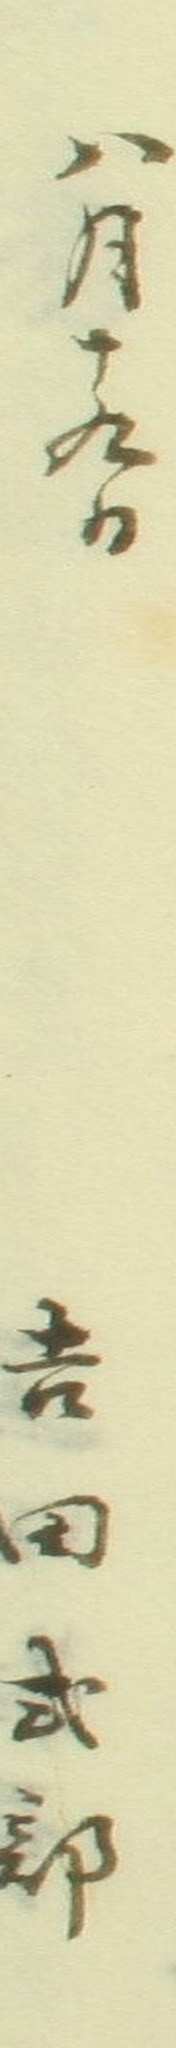八月十九日吉田式部

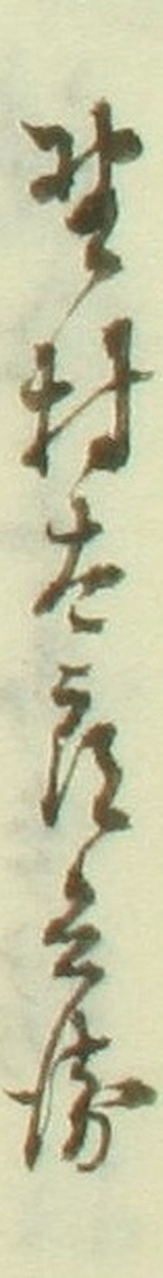野村太郎兵衛
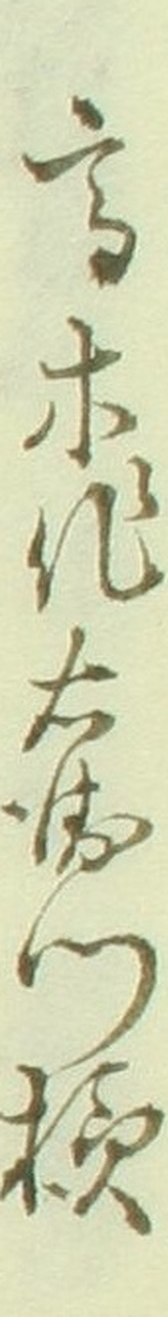高木作右衛門様
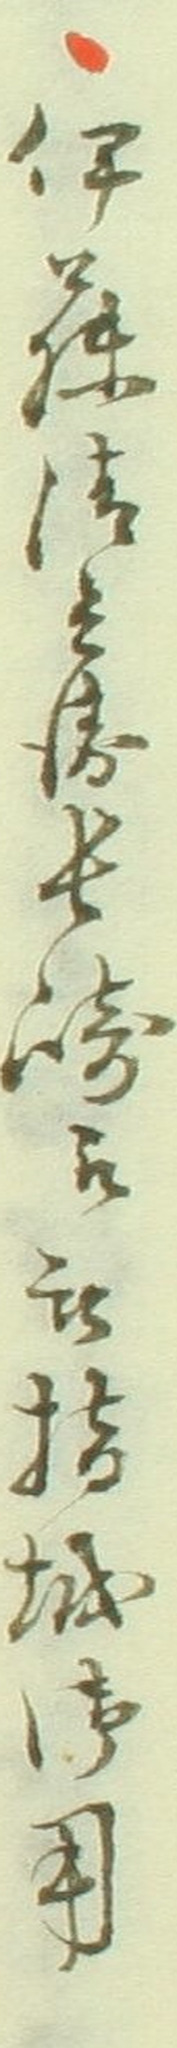伊藤清兵衛長崎え被指越御用
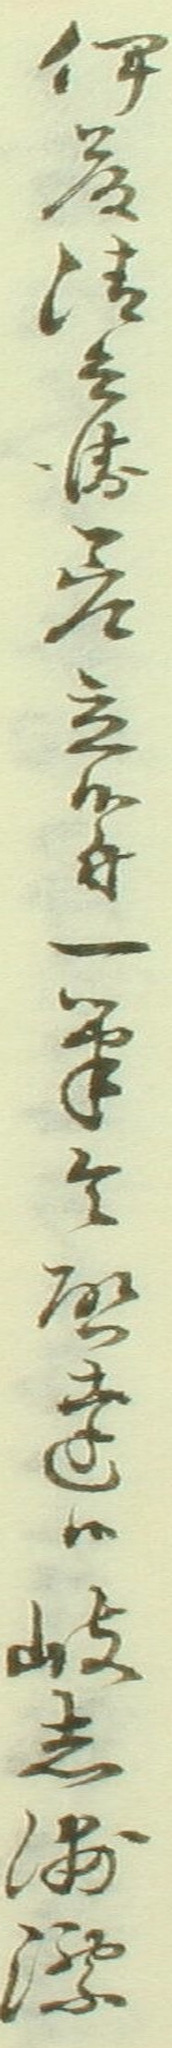伊藤清兵衛差立候付一筆令啓達候岐志浦漂
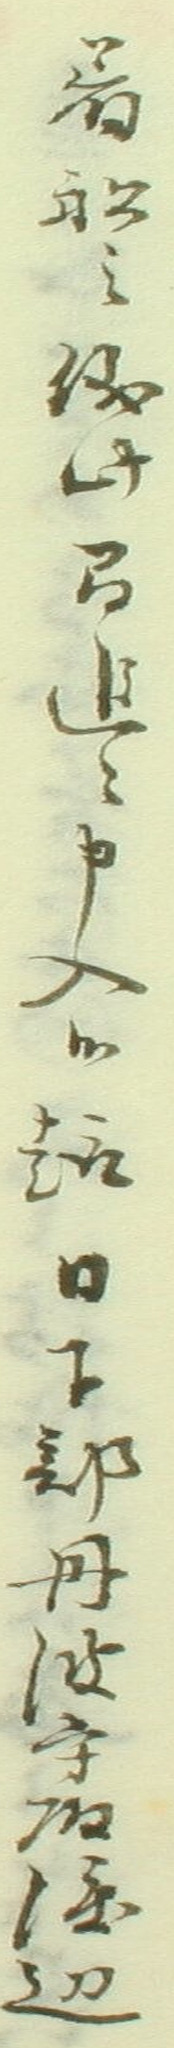着船之儀此間追々申入候趣日下部丹波守殿渡辺
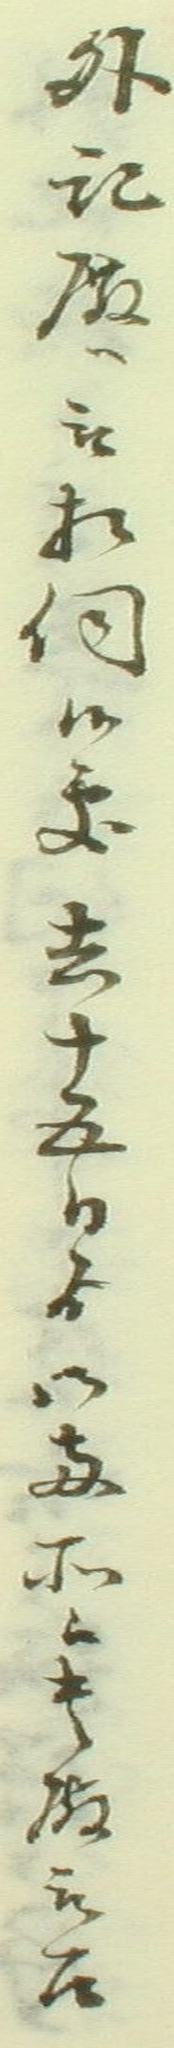外記殿へ被相伺候処去十五日ゟ御両所え貴殿被召
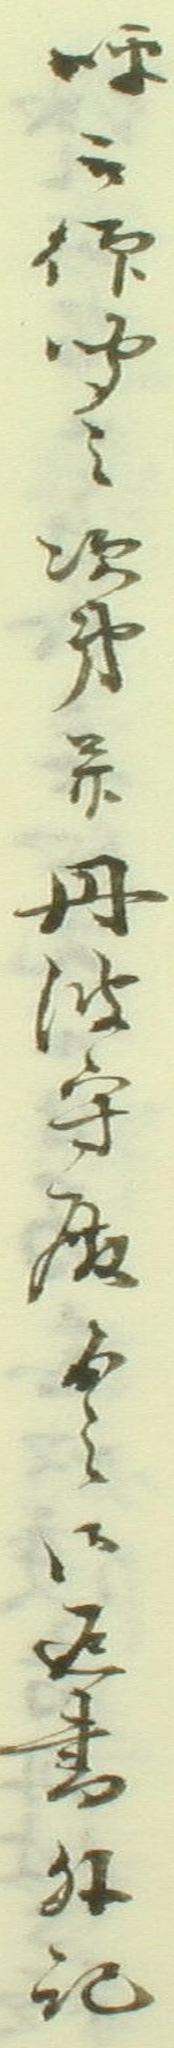呼被仰聞之次第并丹波守殿ゟ之御返書外記
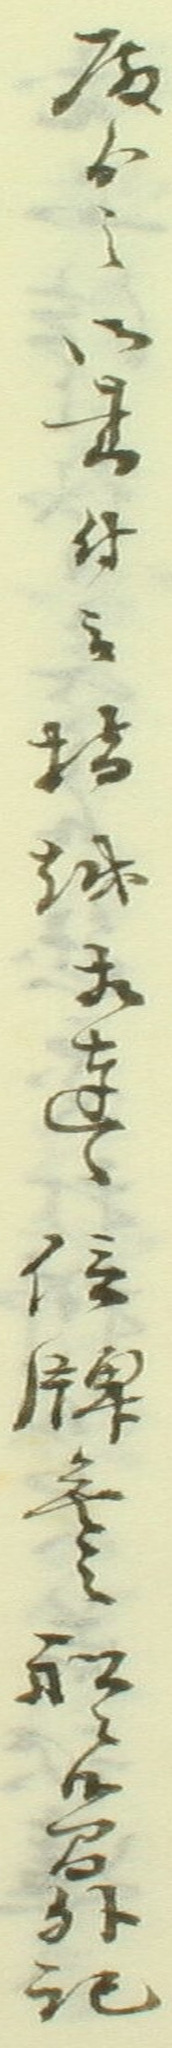殿ゟ之御書付被指越相達候信牌無之船に候間外記
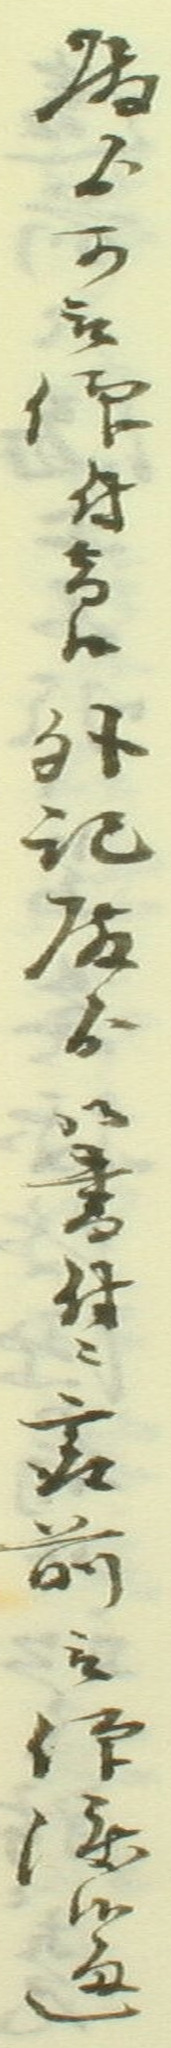殿ゟ可被仰付旨候外記殿ゟ御書付に最前被仰渡候通
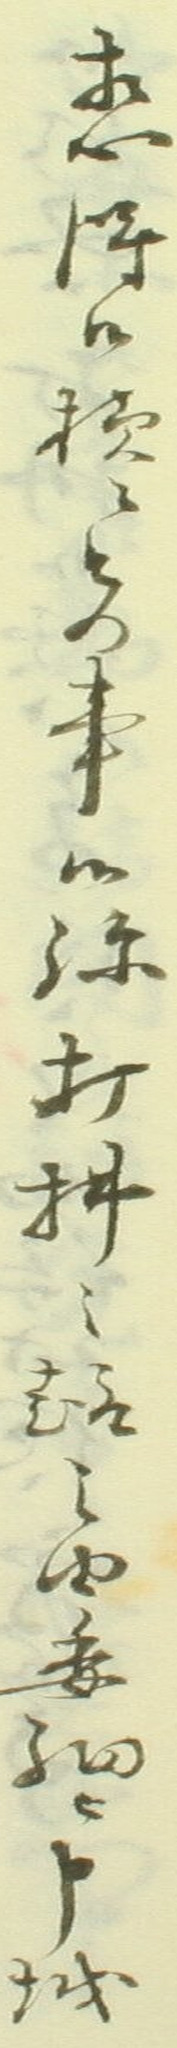相心得候様にとの事候弥打払之趣之由委細被申越
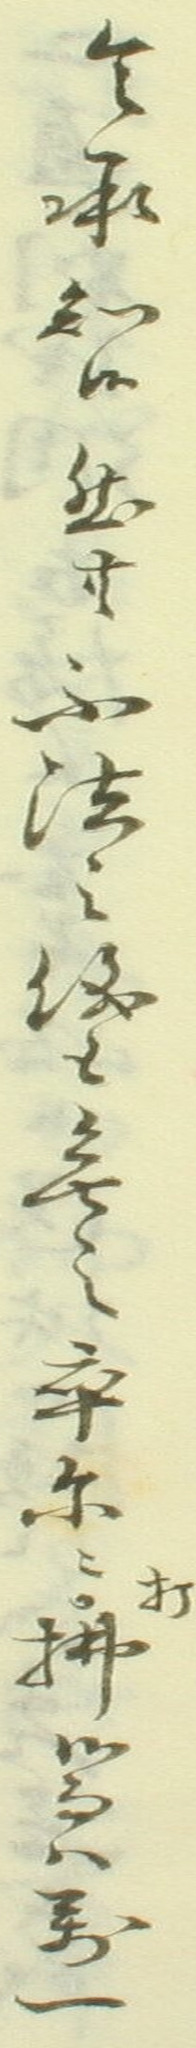令承知候然共不法之儀も無之卒爾に◦払候而は万一
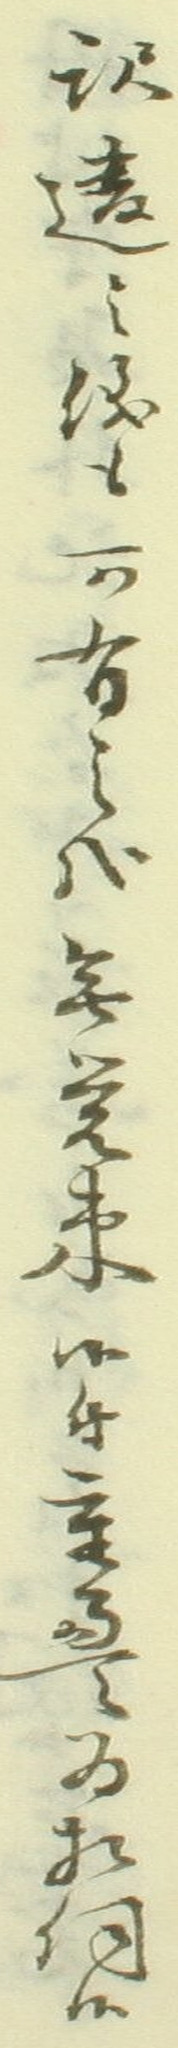訳違之儀も可有之哉無覚束候付重畳為相伺候
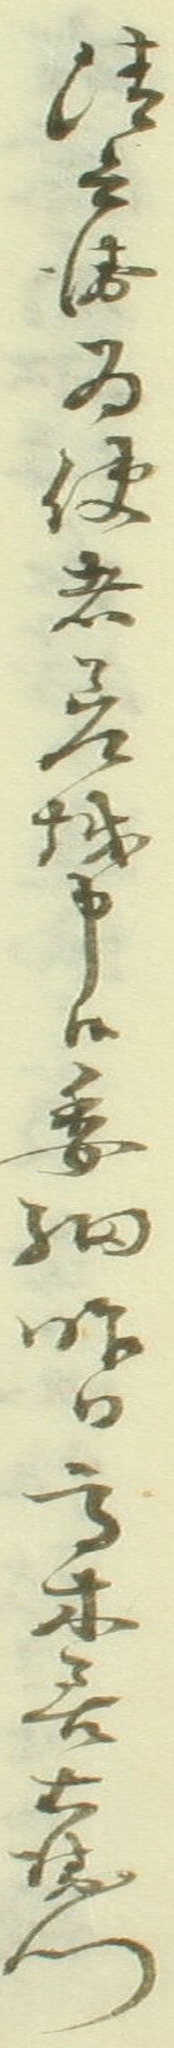清兵衛為使者差越申候委細昨日高木善右衛門
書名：異国船漂着記
